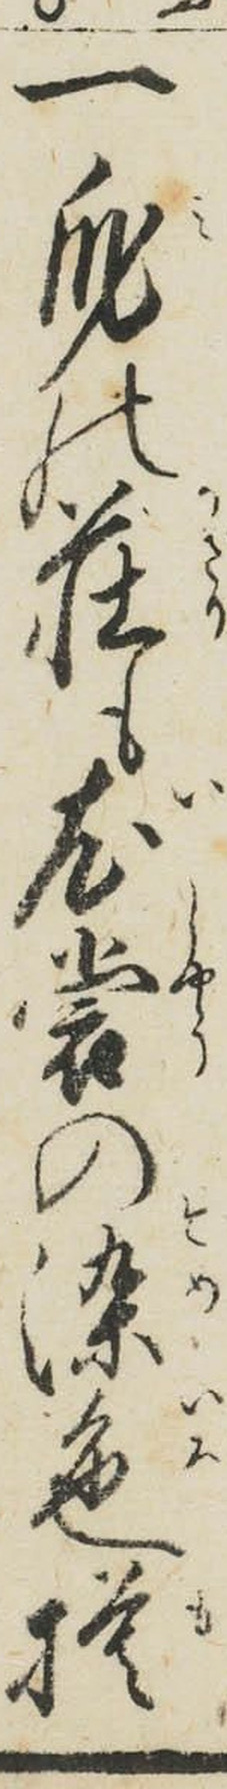一身の荘も衣裳の染色模
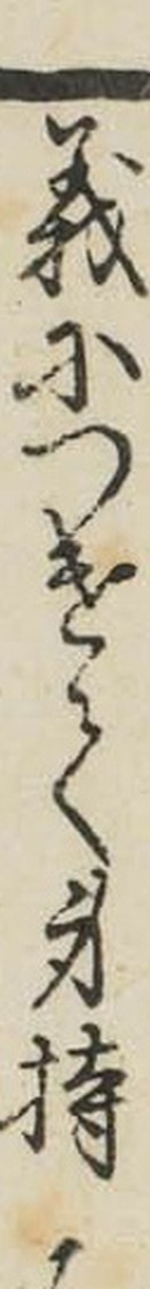義につけて身持
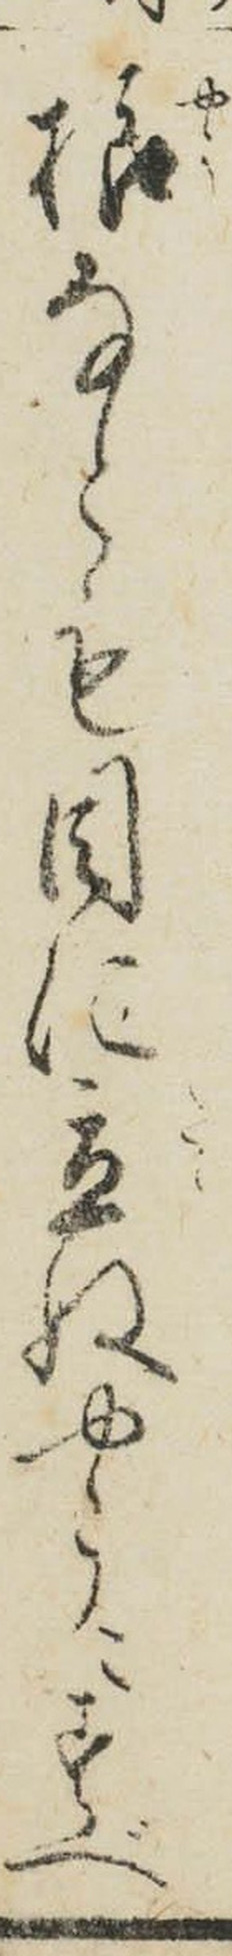様なとも目に立ぬやう
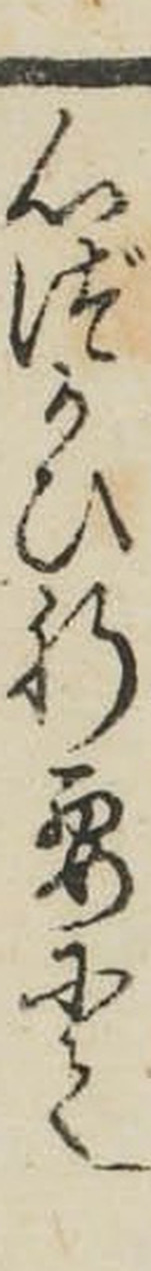心づかひ肝要にて
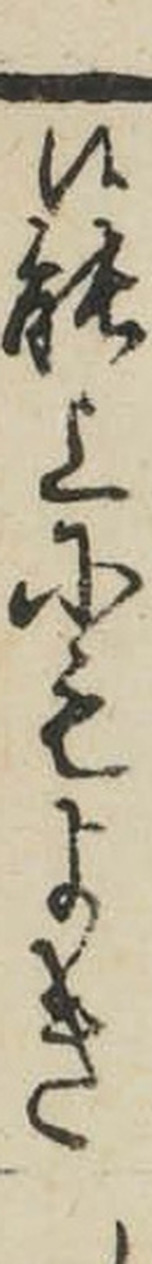候能上にもよき
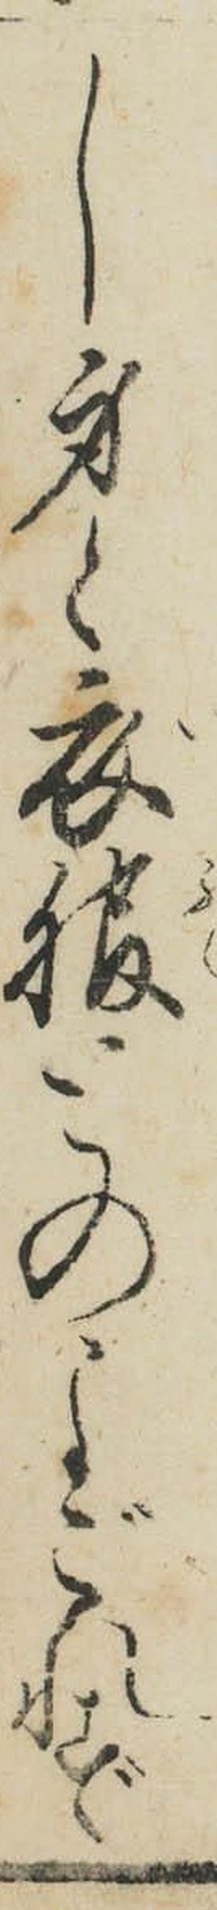し身と衣服とのよごれず

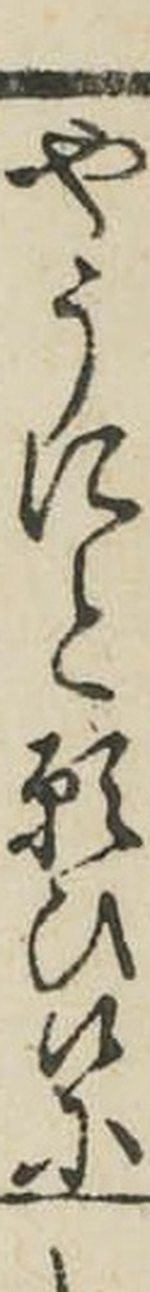やうにと願ひ候に
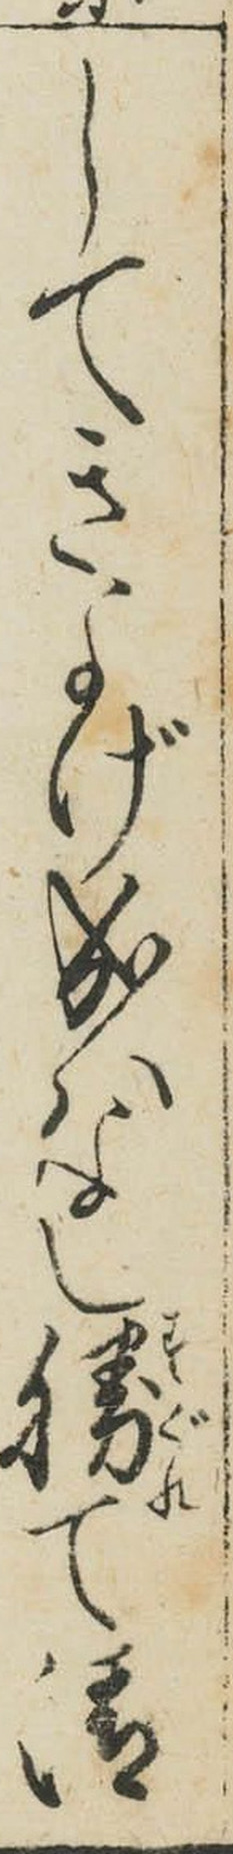してきよげ成はよし勝て清
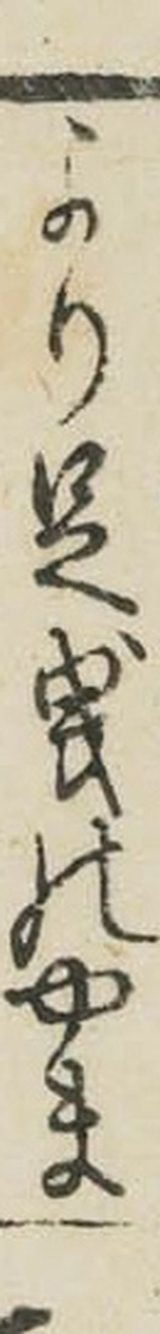より足曳のやま
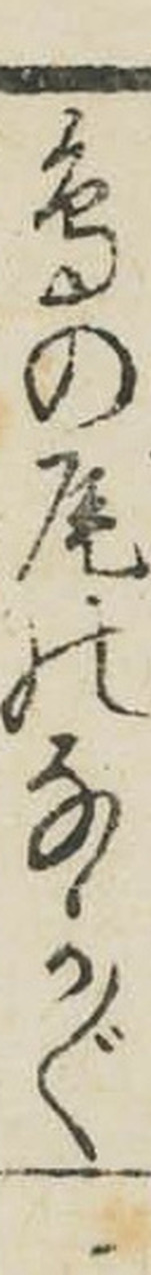鳥の尾のなか〴〵
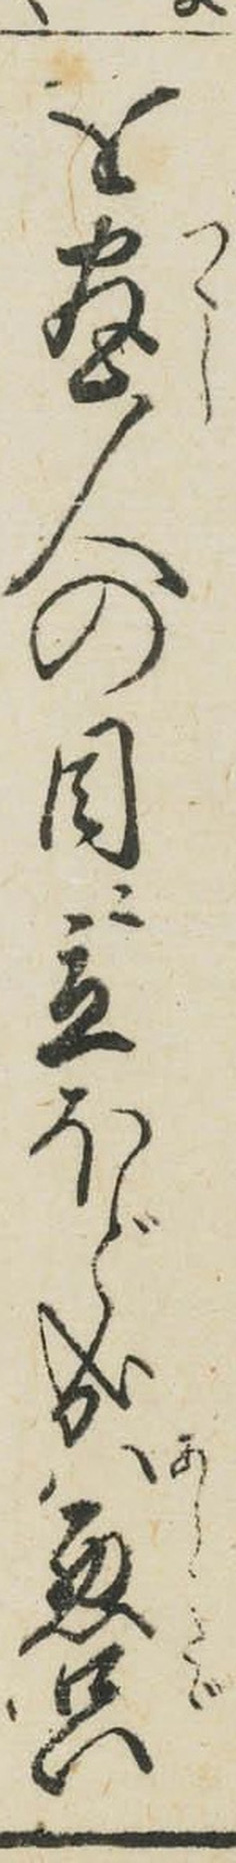を尽人の目立ほど成は悪只
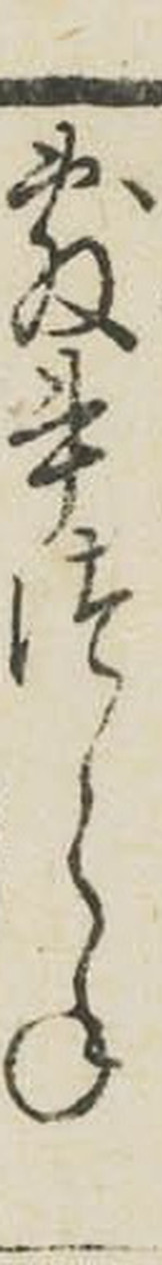敷書つらね
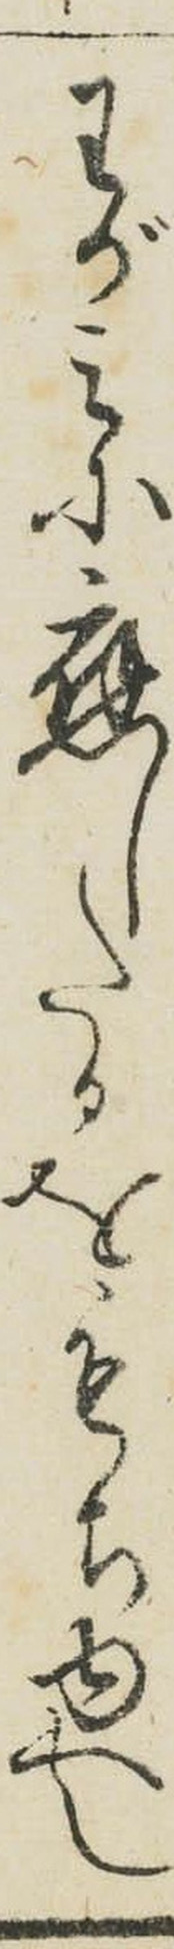わがみに応したるをもちゆへし
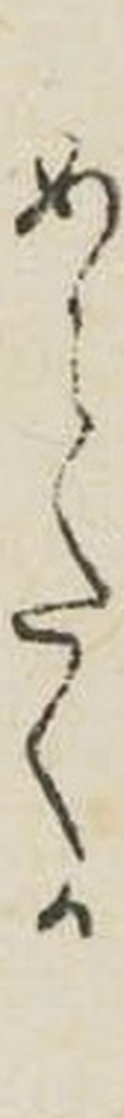めてたくか
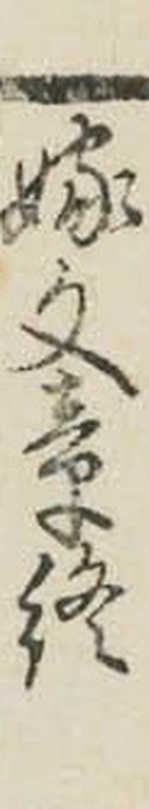嫁文章終
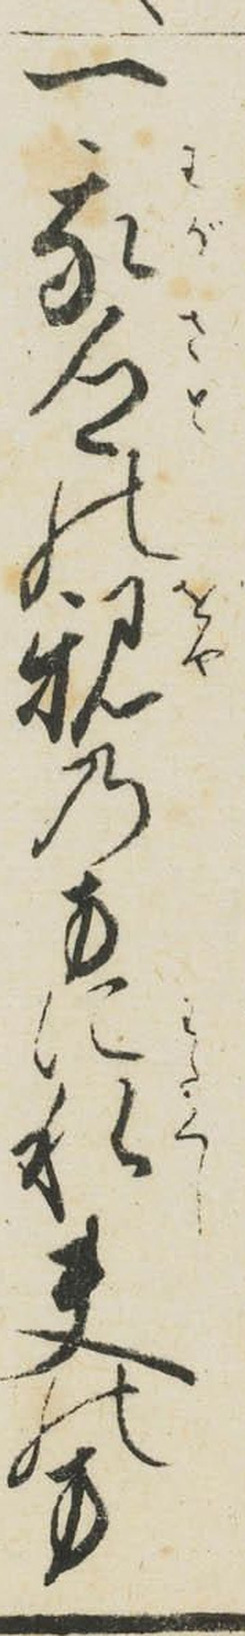一我郷の親の方に私夫の方
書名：女大学
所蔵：東京学芸大学教育コンテンツアーカイブ
